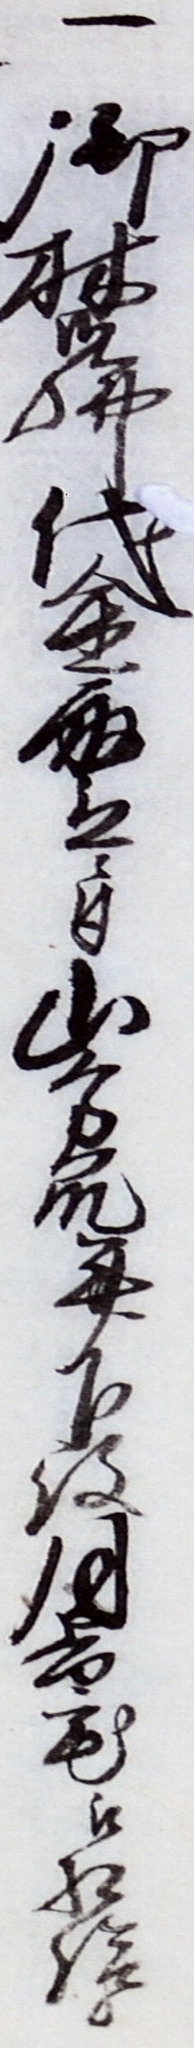一御林御払代金取立ニ付山方衆并下役月番宅江相詰候
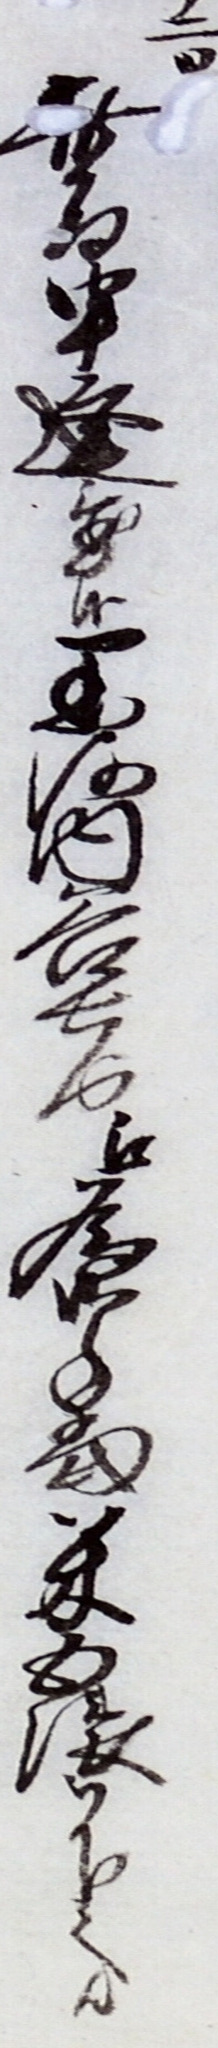一此旨申達置候黒河内善右衛門江為御手当米五俵被下之候
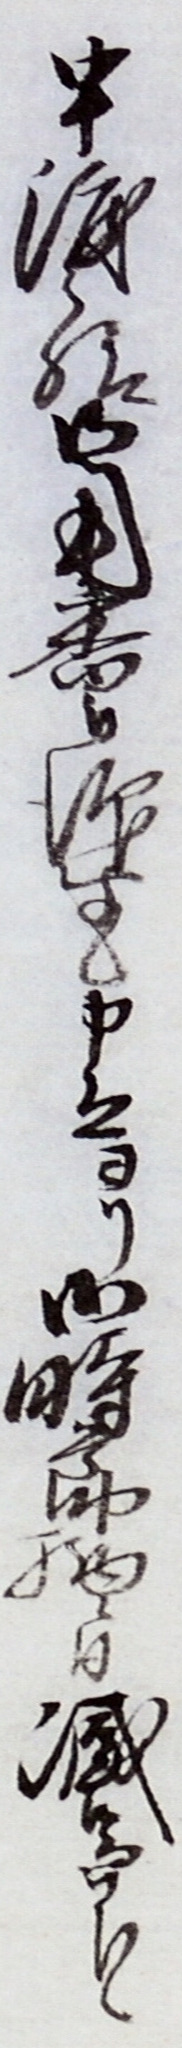申渡候様御用番被仰付候申立ヨリ御時節柄ニ付減候而被下候
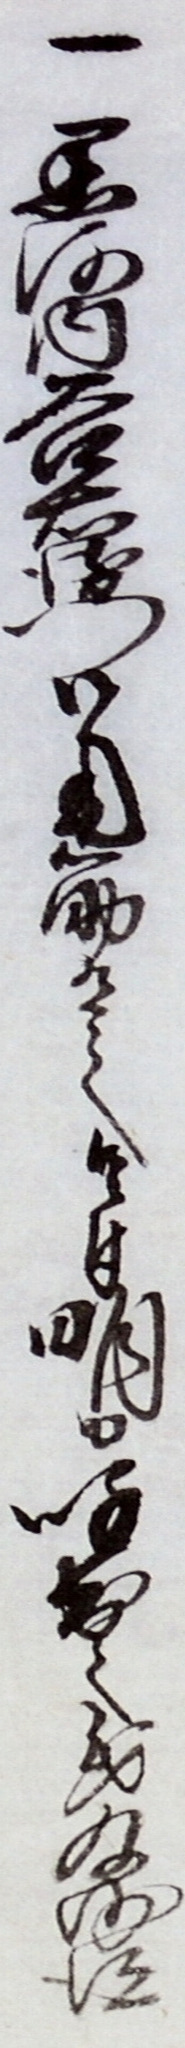一黒河内善右衛門御用筋有之候ニ付明日呼出之義及沙汰
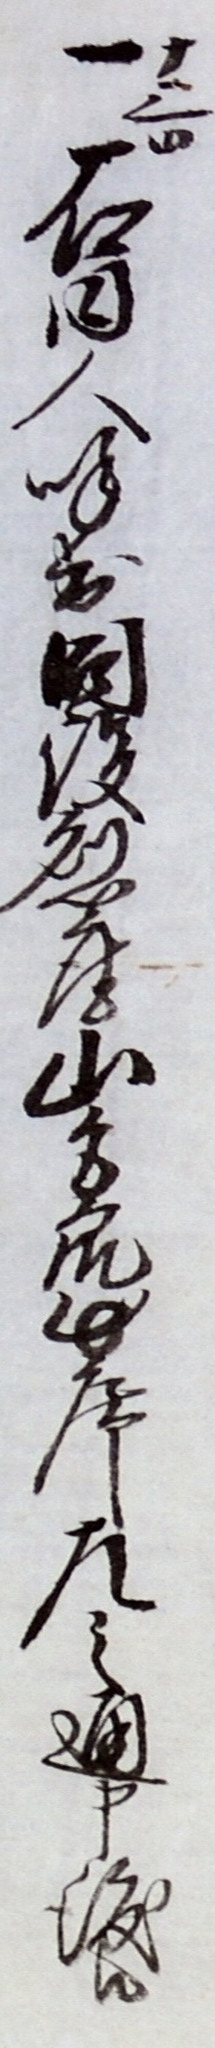一右同人呼出同役則御座山方衆出席左之通につき
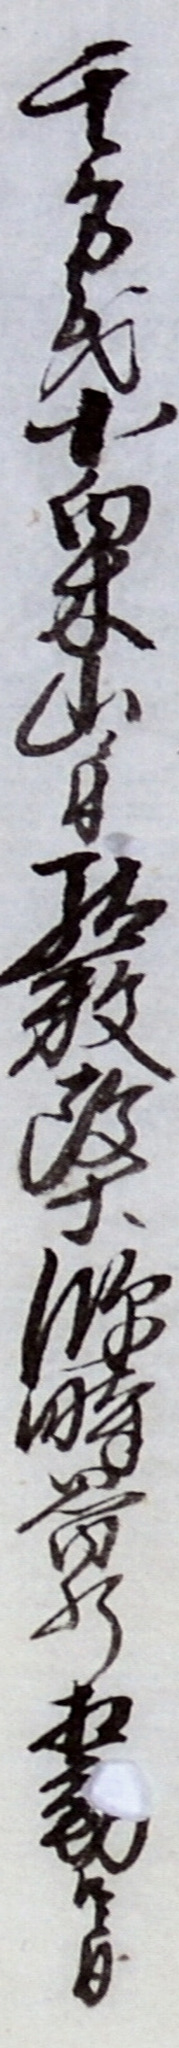其方義小白木山ニ付駄数改等臨時骨折相勤候ニ付
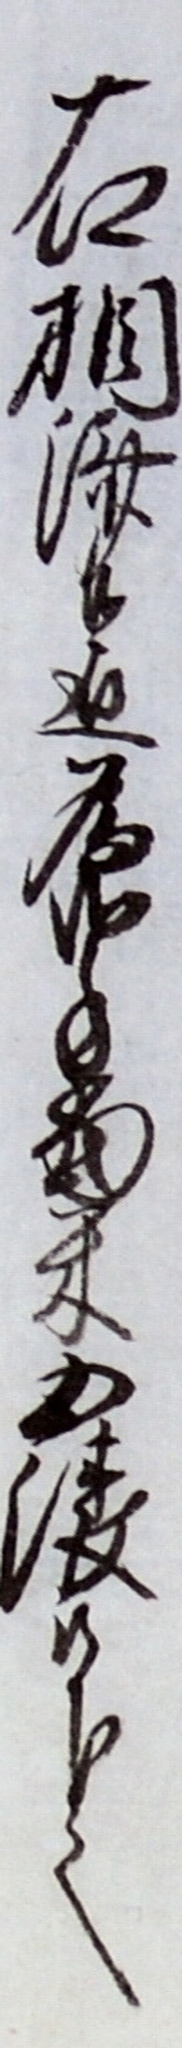右相済候迄為御手当米五俵被下之
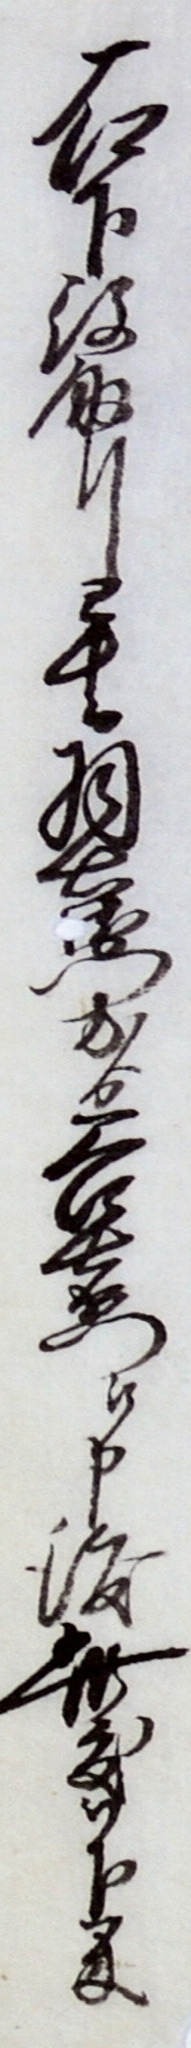右下役取引畢而羽右衛門方ゟ善右衛門被申渡此度被下米

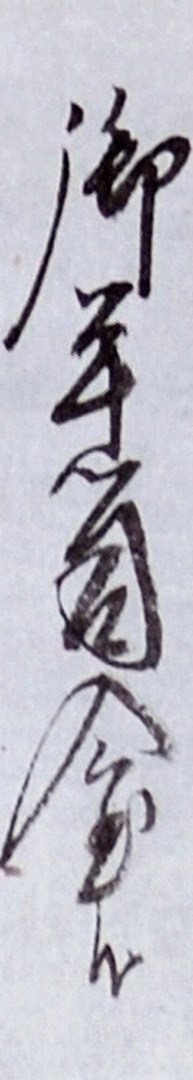御書笥入置候
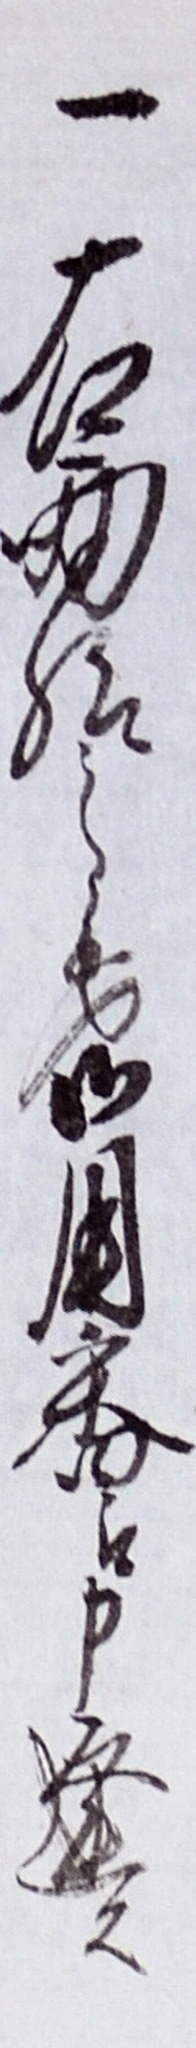一右両様之義御用番江申達ス
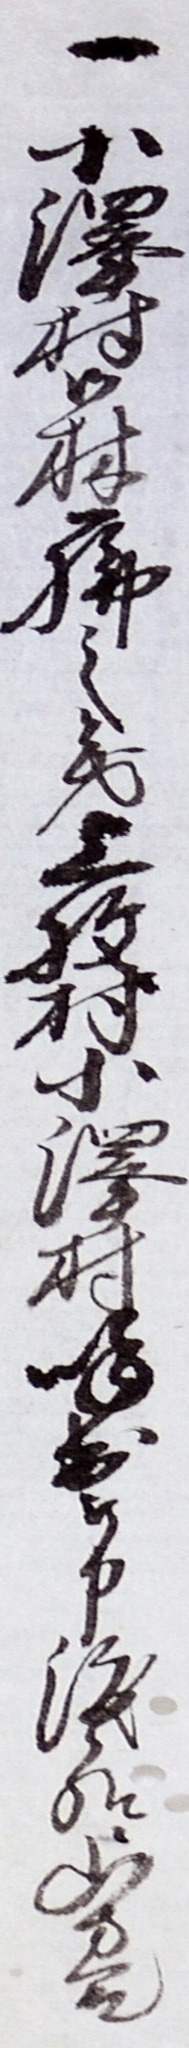一小澤村御林払之義上牧村小澤村呼出被申渡候様山方衆
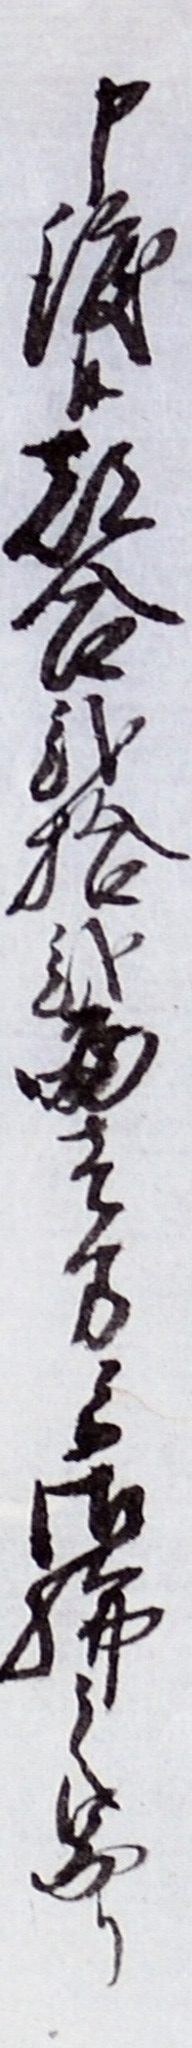申渡候都合弐拾弐両壱分ニ而御払之図り
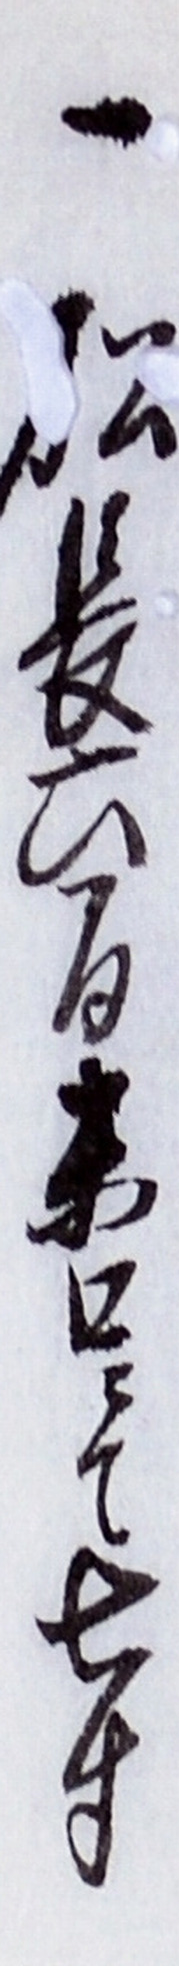一松長六間末口ニて七寸
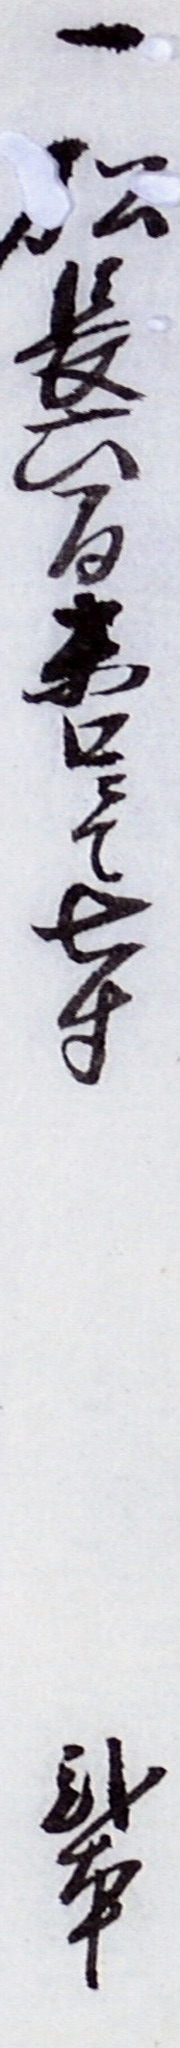一松長六間末口ニて七寸
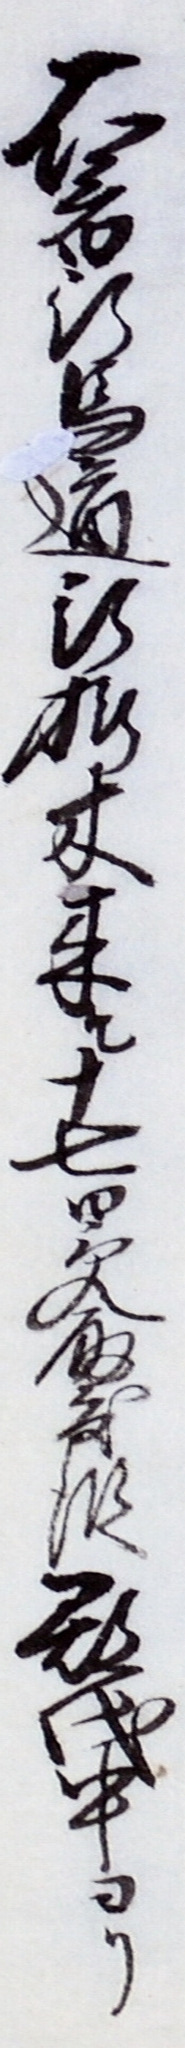右は行馬道行桁木来ル十七日受取度段郡代中ヨリ
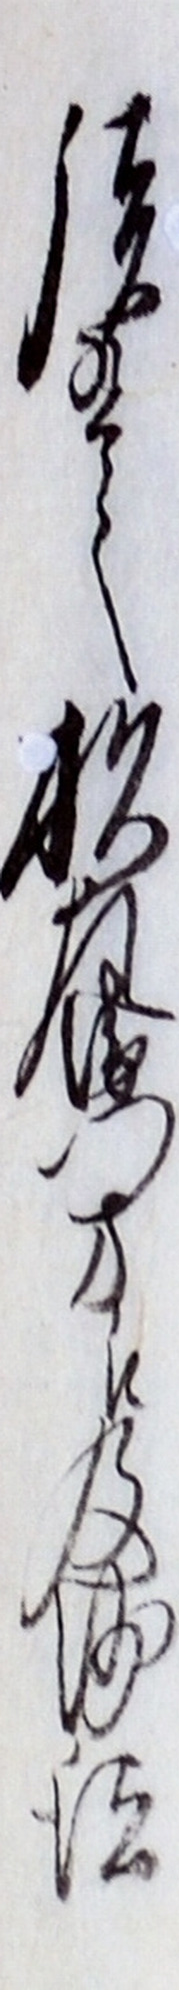談有之杉左衛門方江及沙汰
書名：御山奉行御用控
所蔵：伊那市立高遠町図書館・合同会社AMANE
